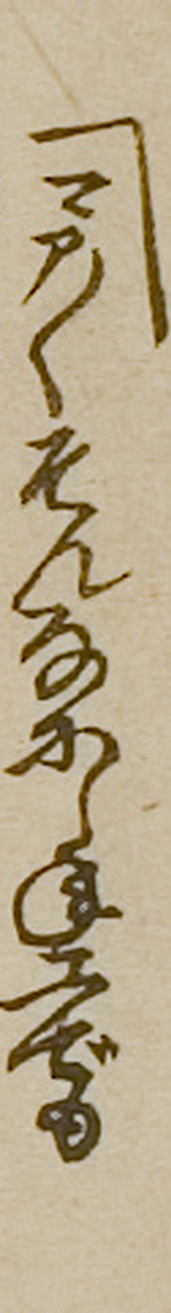「まあ〳〵そんなにしねえでも
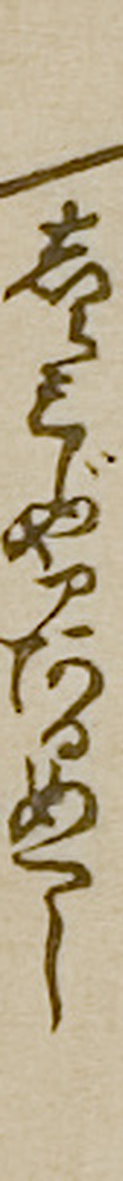「しらみじやああるめへし
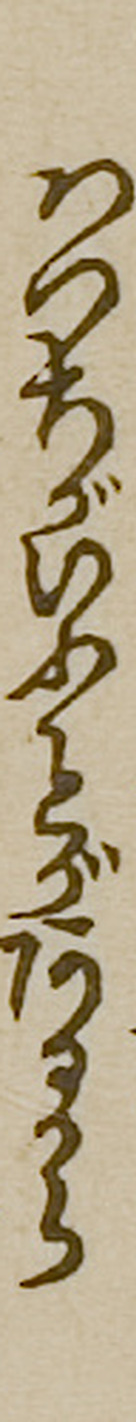わつちがいふことがあるから
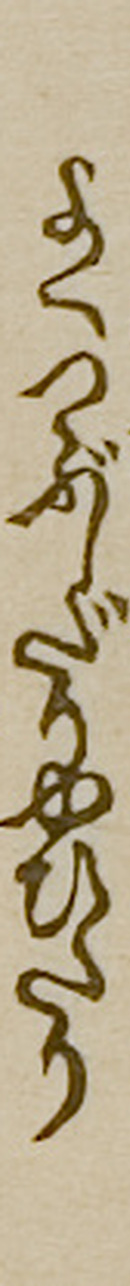よくつぶしだりやひたり
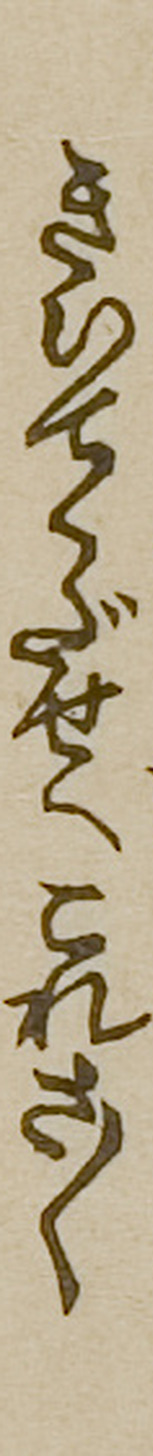きいてくだせへこれさ〳〵
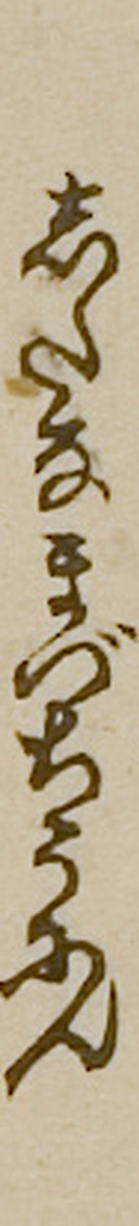したなまづちうにん
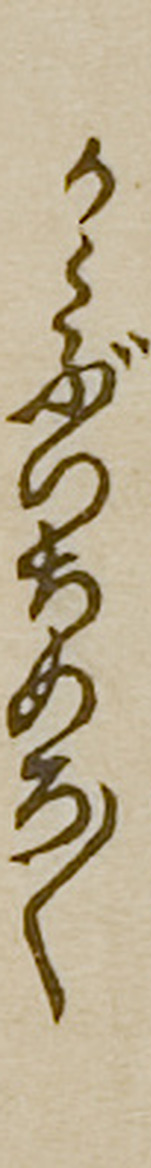かみぶつちめろ〳〵
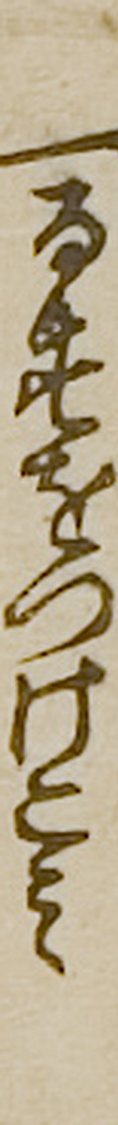「るすをつけこみ
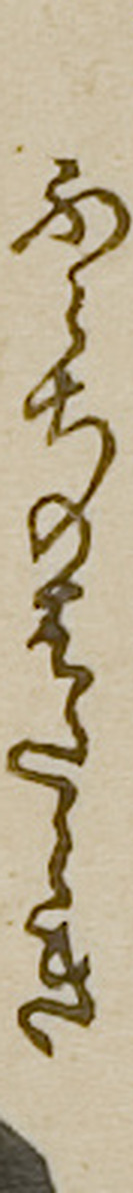ふらちのはたらき
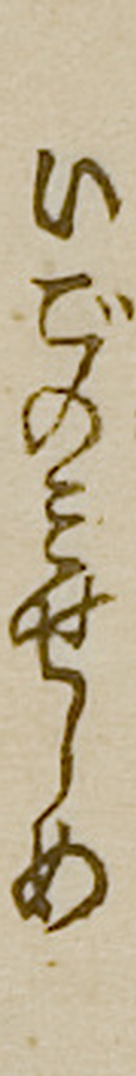いごのみせしめ
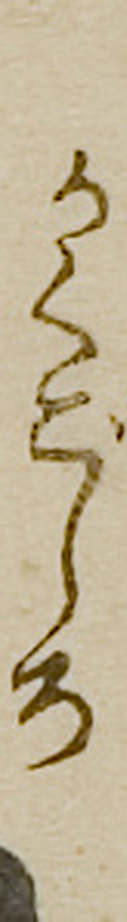かくごしろ
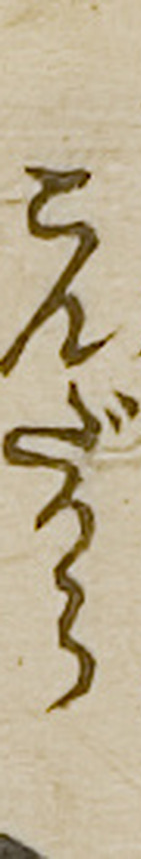こんどから
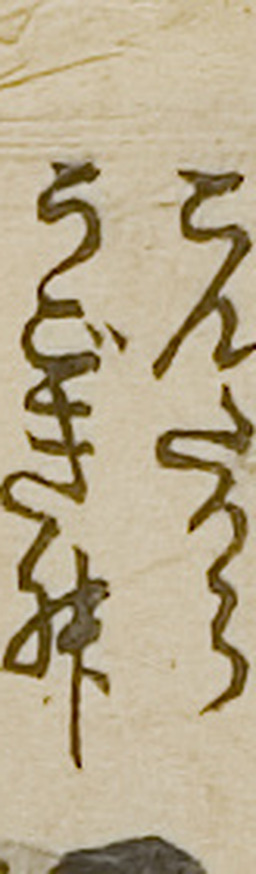うごき升
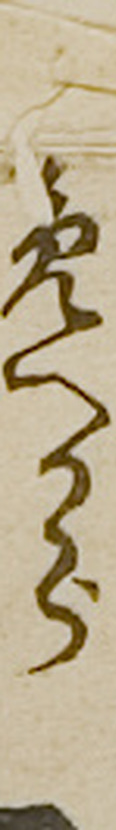めへから
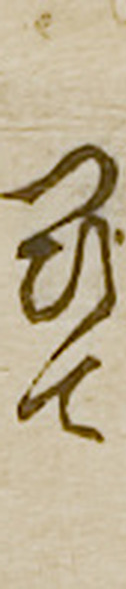つひて
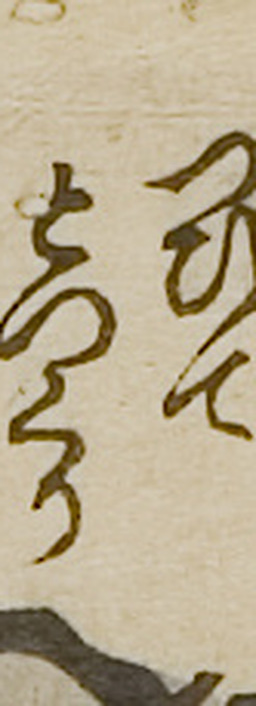とつくり
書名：[鯰へのこらしめ]
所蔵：東京大学総合図書館 General Library in the University of Tokyo, JAPAN
